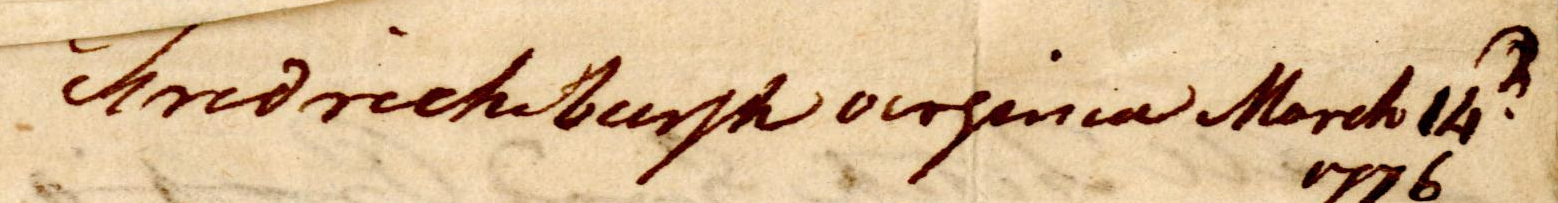Fredericksburgh virginia March 14^th.
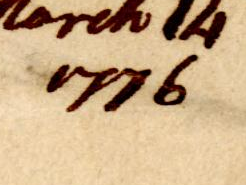1776
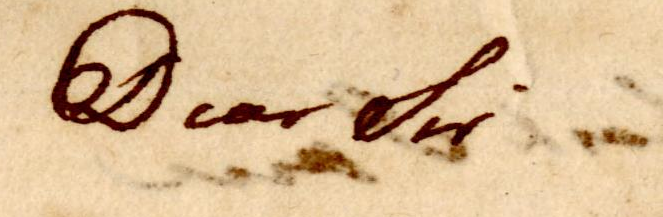Dear Sir
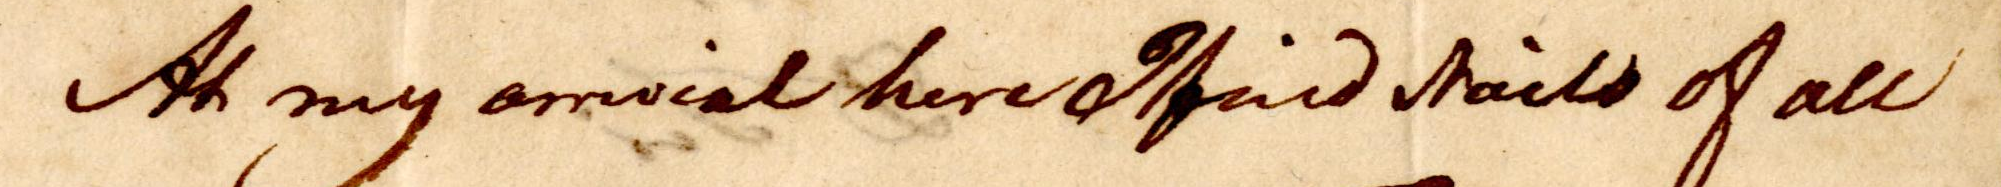At my arrival here I find Nails of all
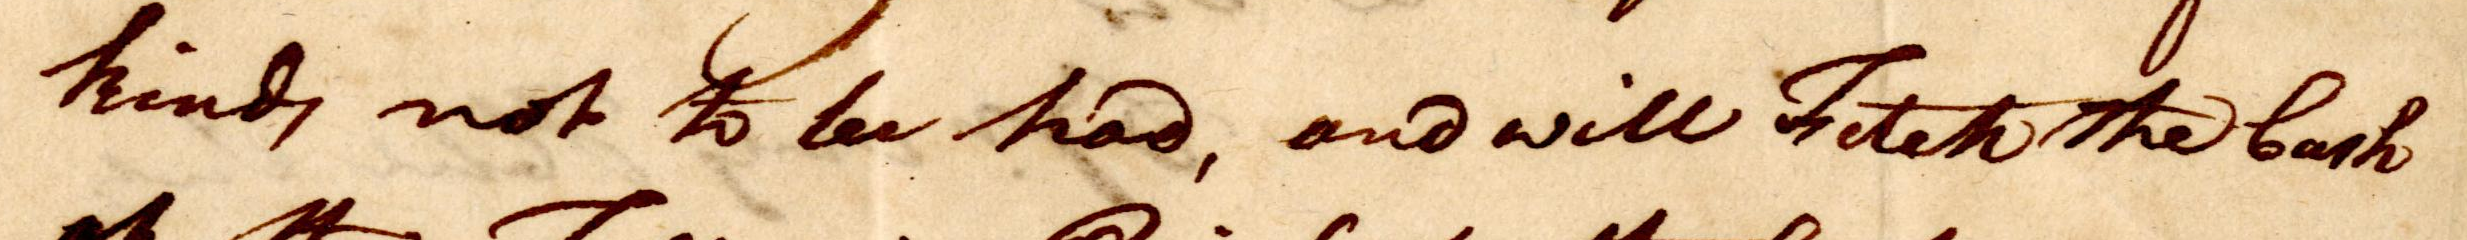kind not to be had, and will Fetch the cash
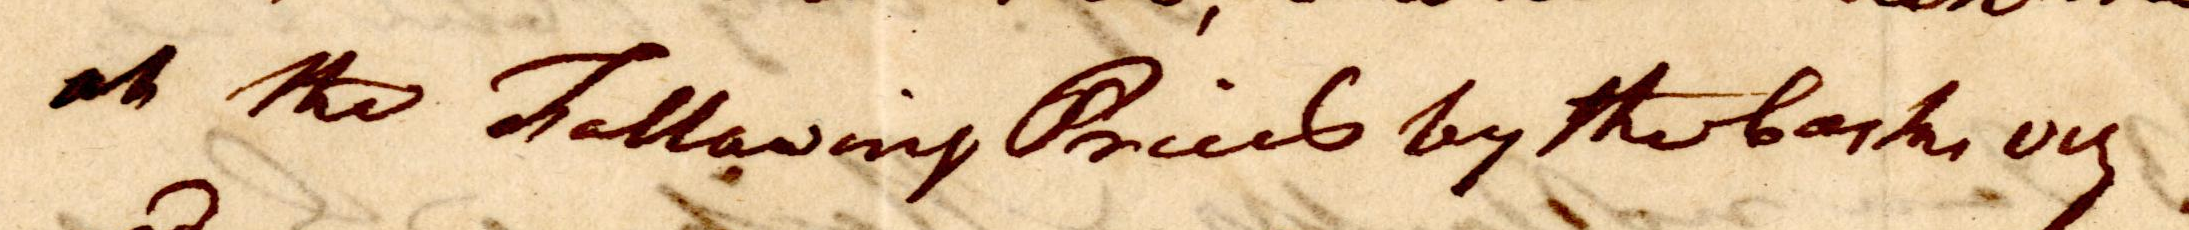at the Fallowing Prices by the Cash viz
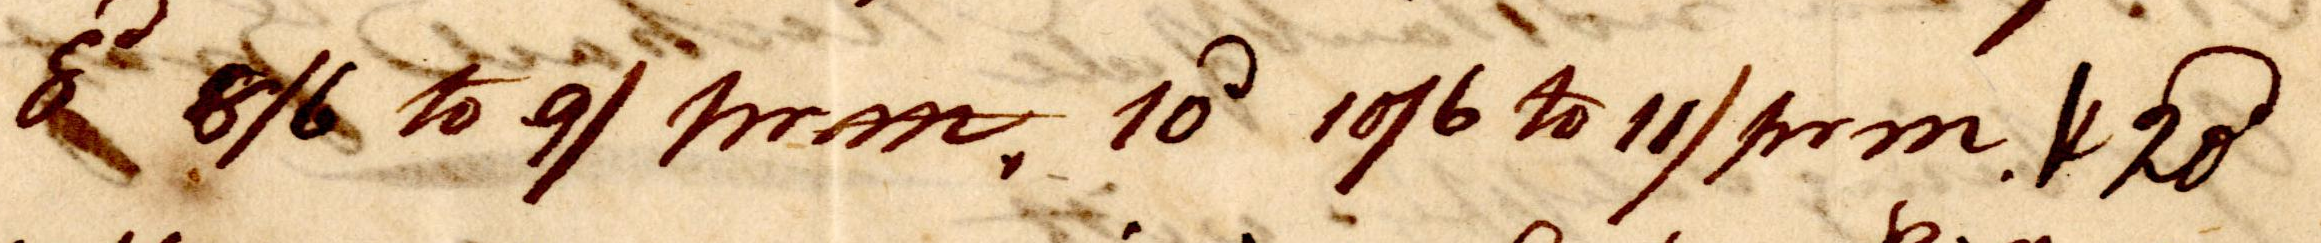8^d 8s6 to 9s pr m. 10^d 10s6 to 10s pr m. & 20^d
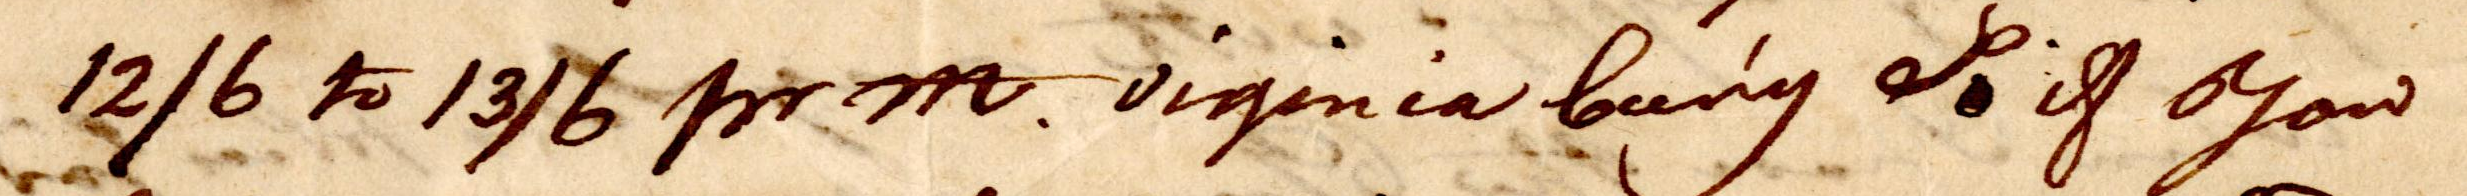12s6 to 13s6 pr m. Virginia Cur'y so if you
